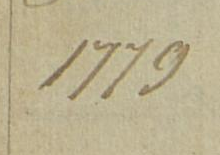1779
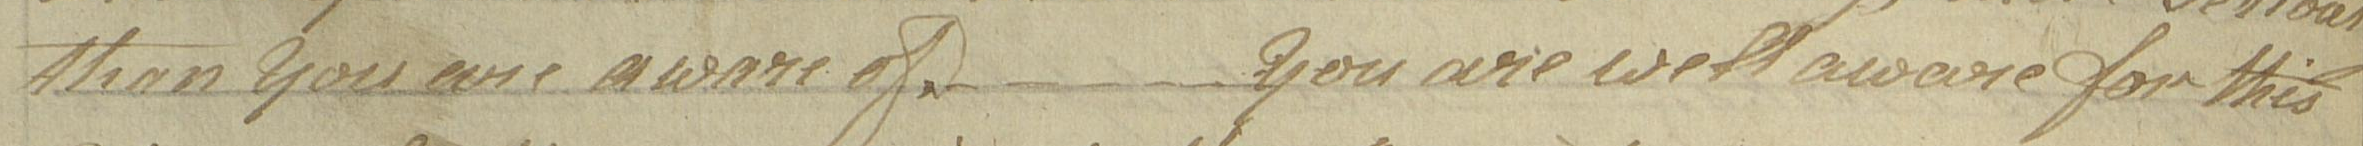than You are aware of, You are well aware for this
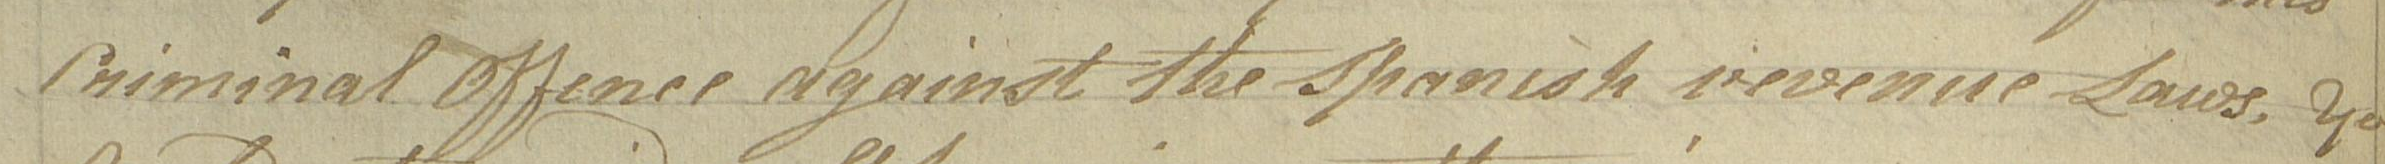Criminal Offence against the Spanish revenue Laws, you
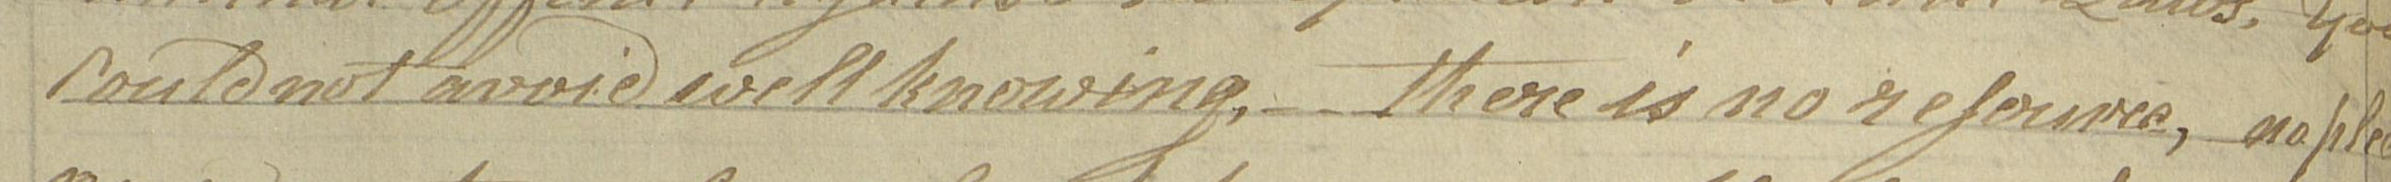could not avoid well knowing, there is no reference, no place
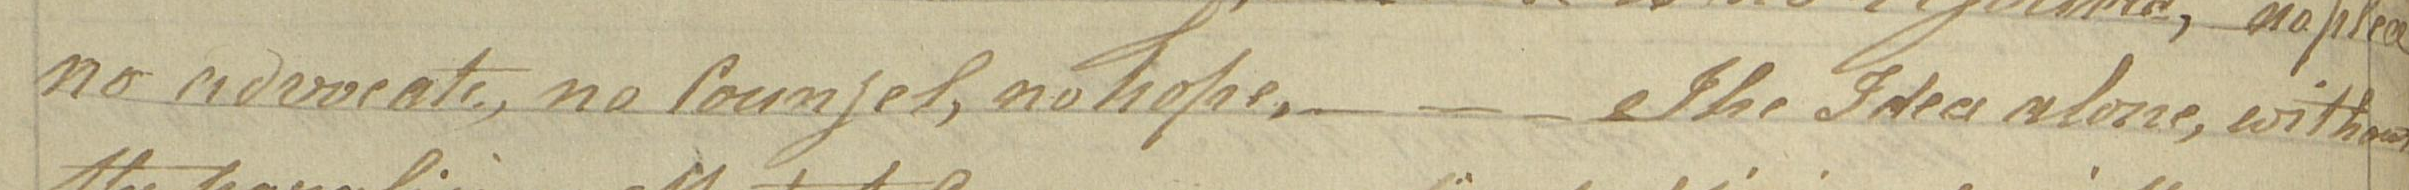no advocate, no Counsel, no hope, The Idea alone, without
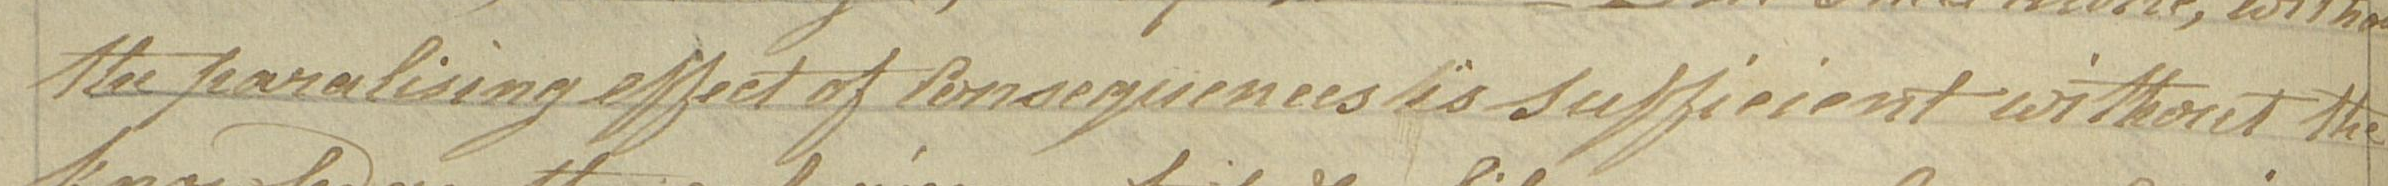the paralising effect of Consequences is sufficient without the
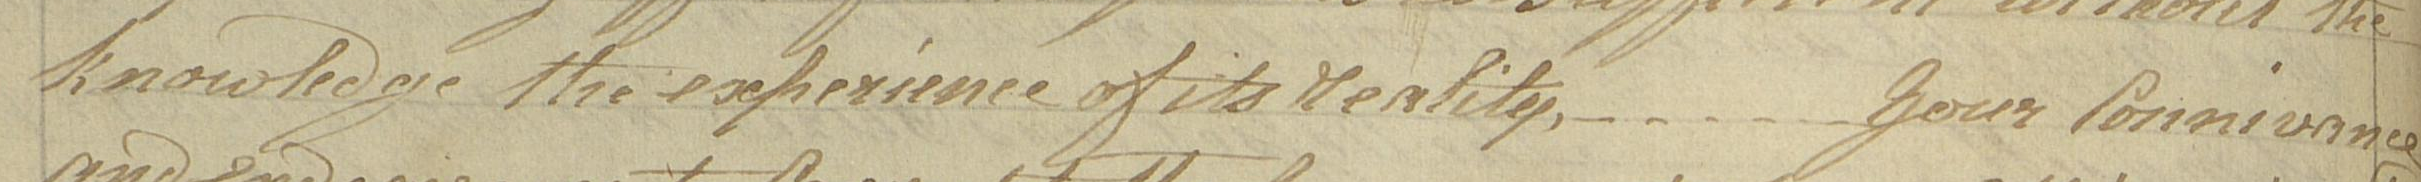Knowledge the experience of its reality, Your Connivance
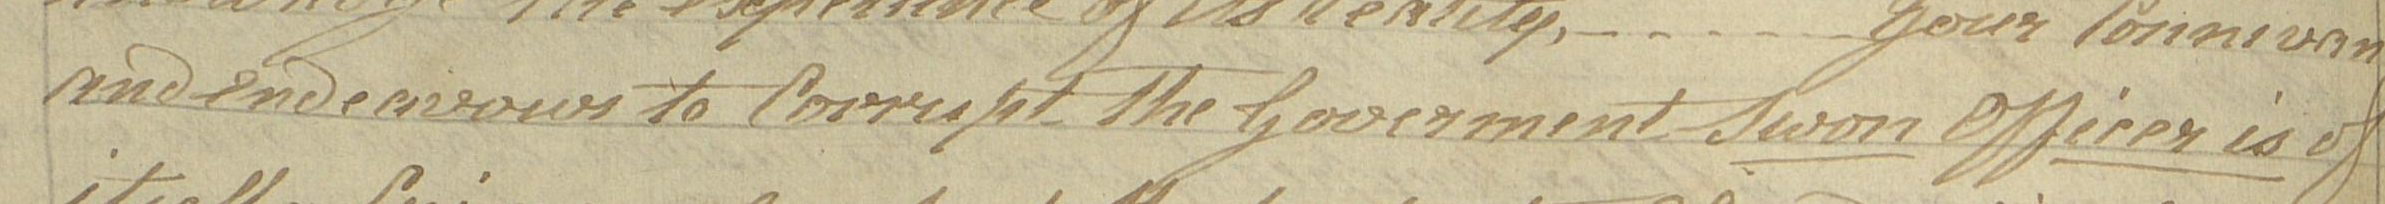and endeavour to corrupt the Goverment Swon Officer is of
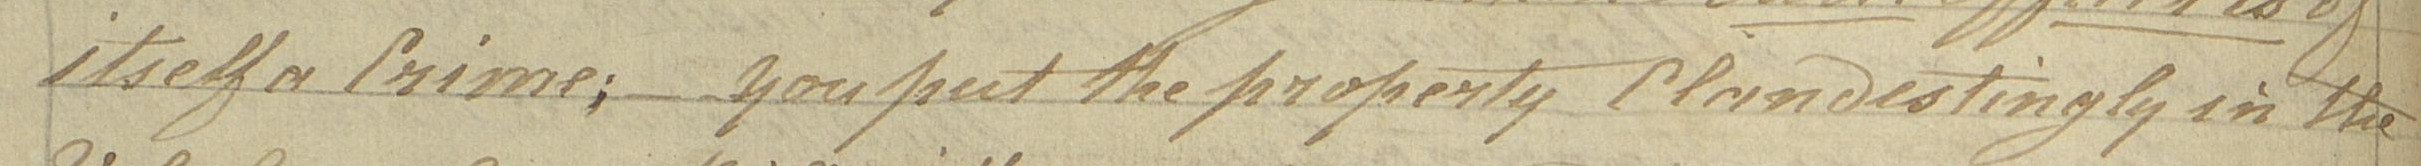itself a Crime; you put the property Clandestingly in the
